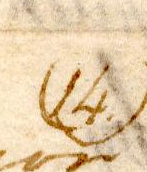14
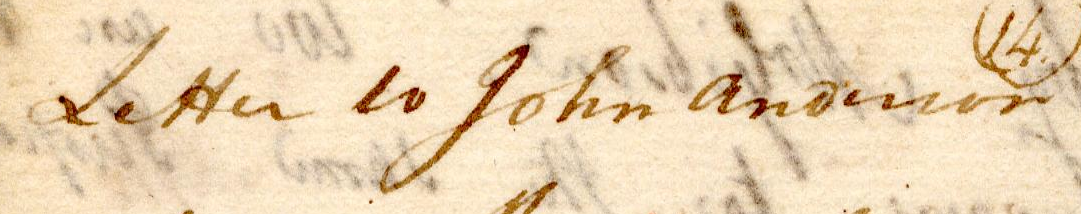Letter to John Anderson
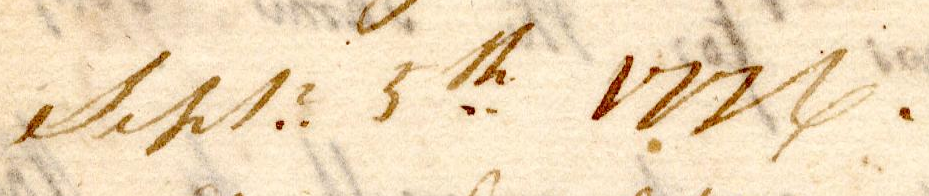Sept^r. 5^th. 1776.
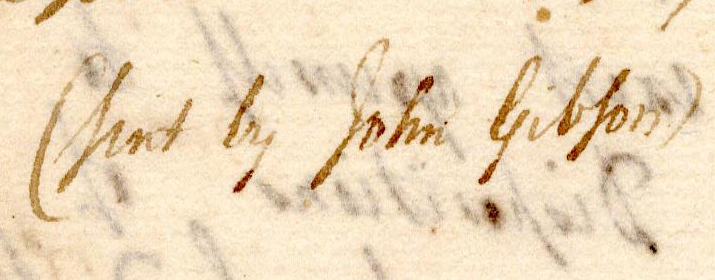(sent by John Gibson)
